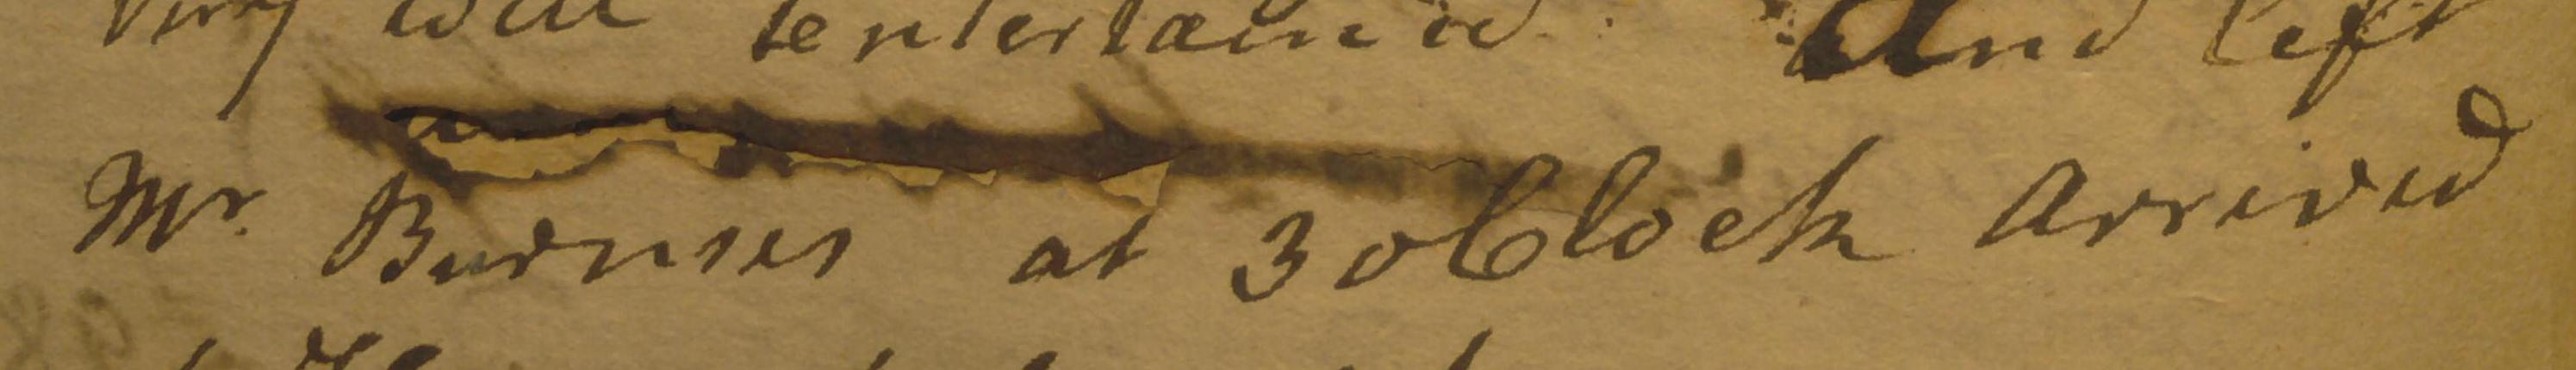M^r. Burnses, at 3 oClock arrived
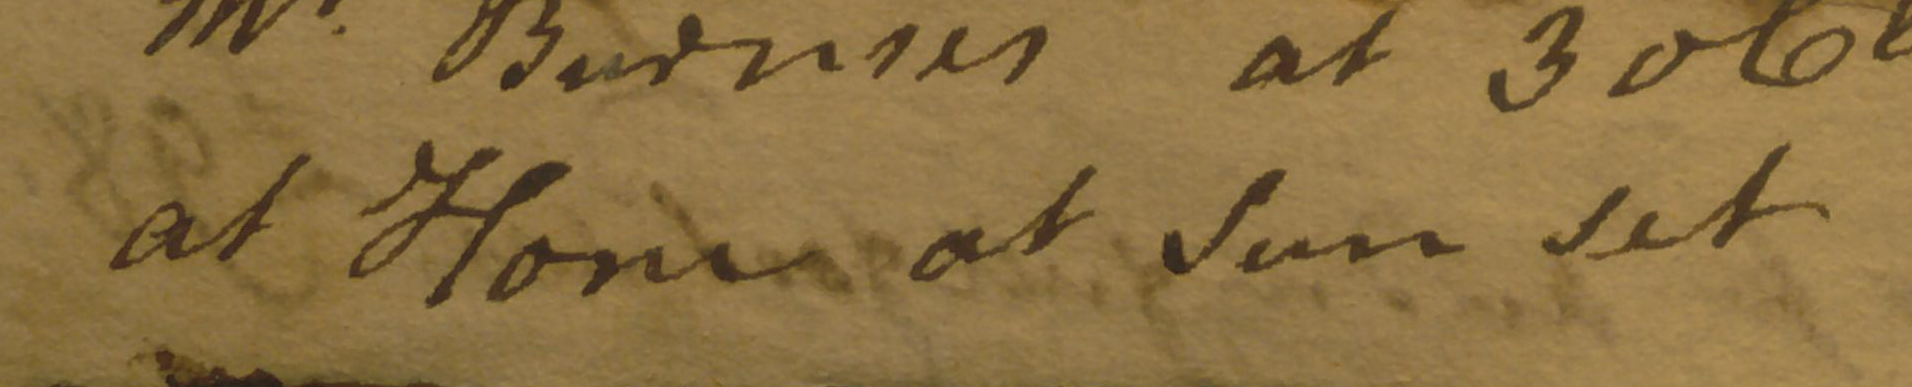at Hone at sun set
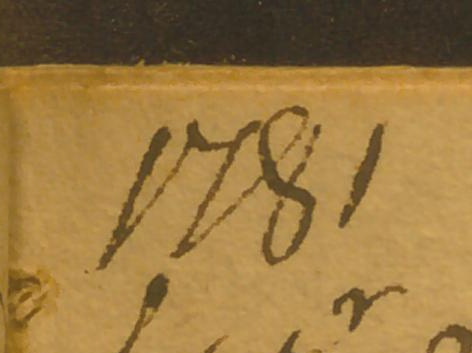1781
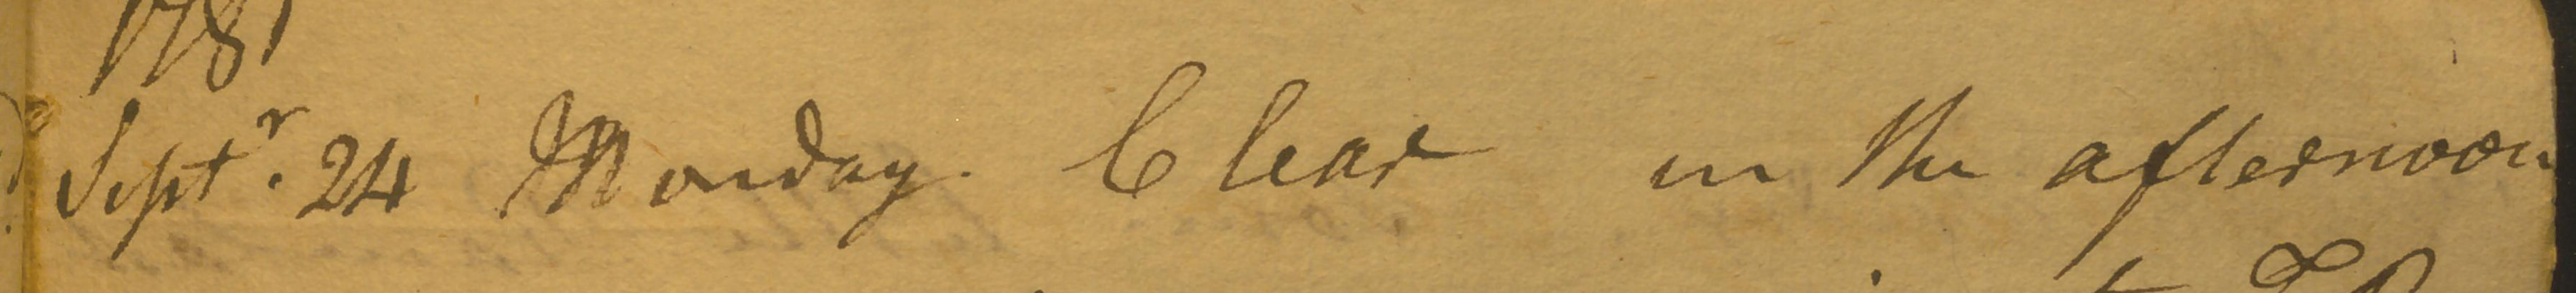Sept^r. 24 Monday. Clear in the afternoon
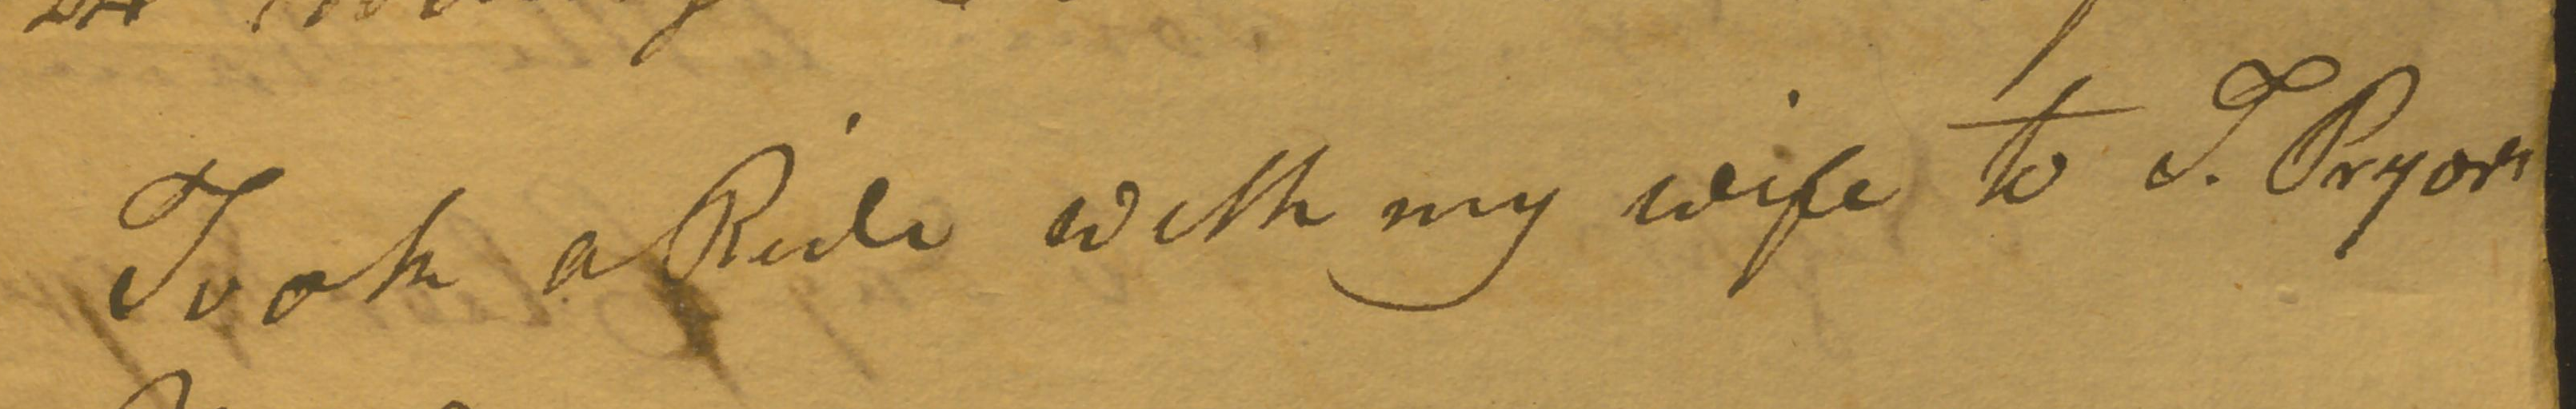Took a Ride with my wife to T. Pryor
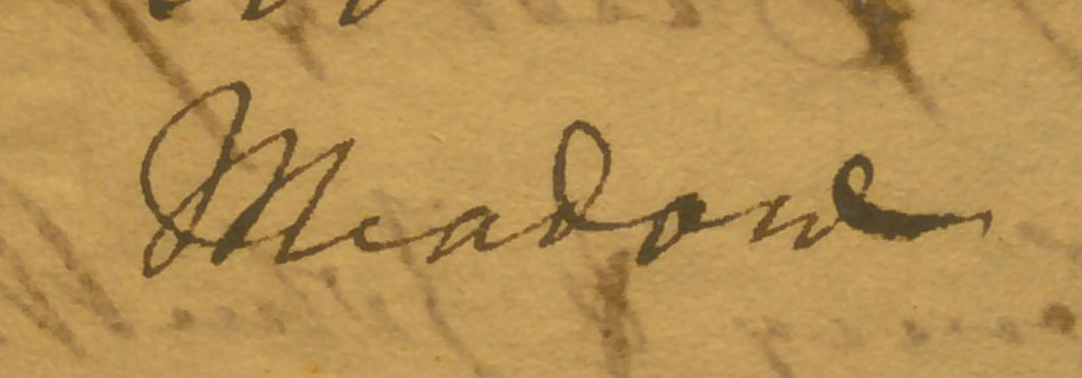Meadow
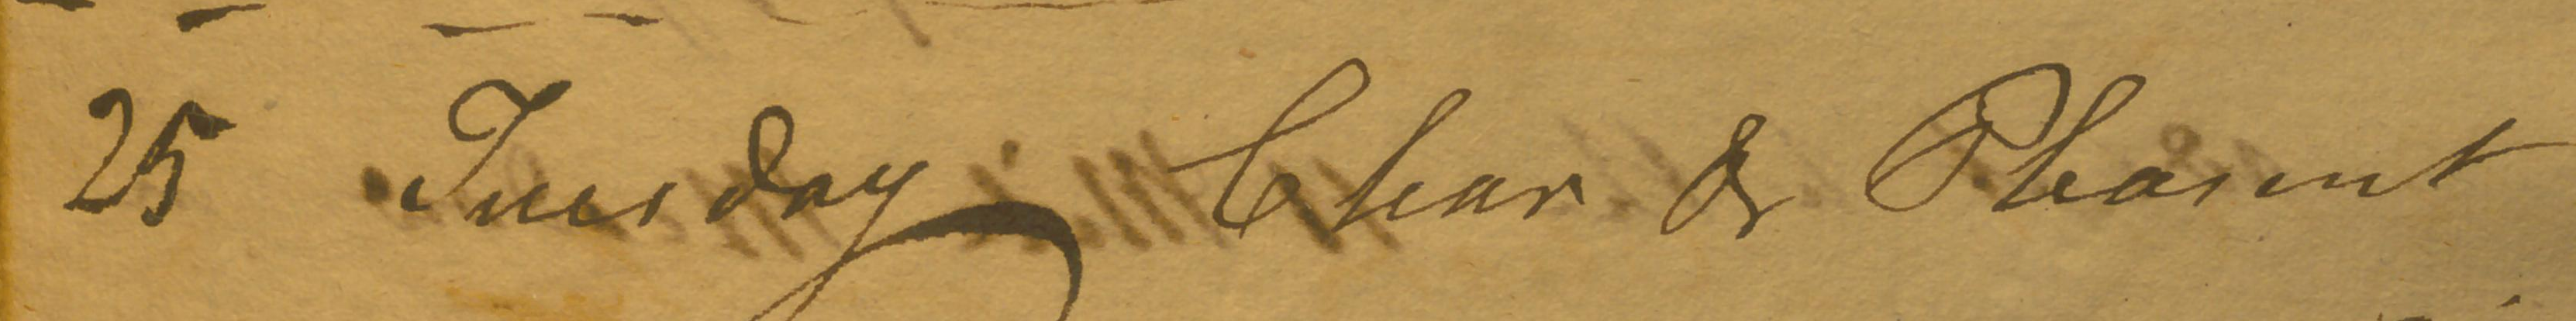25 Tuesday Clear & Pleasent
